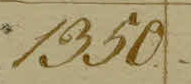1350.
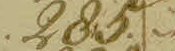285.
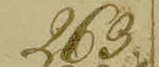263.
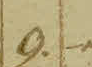9.
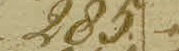285.
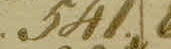541.
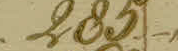285.
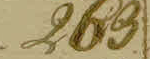263
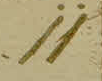11
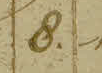8.
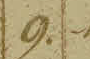9.
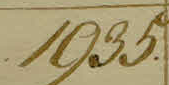1935.
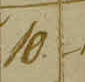10.
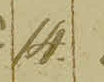14.
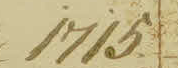1715.
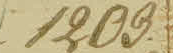1203.
